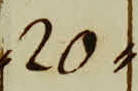20
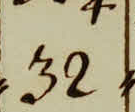32
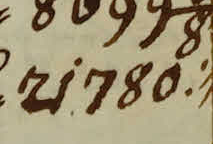21780
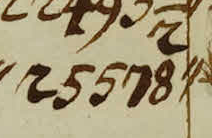25578
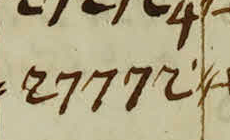27772
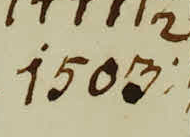1503
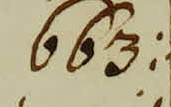663
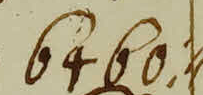6460.
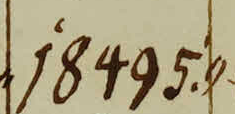18495.
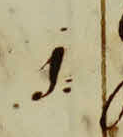1:
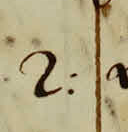2:
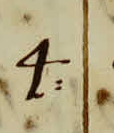4:
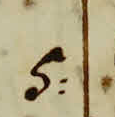5:
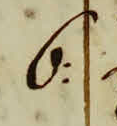6:
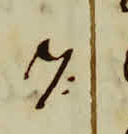7:
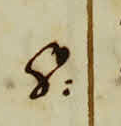8:
